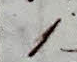1
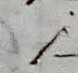1
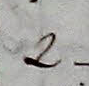2
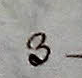3
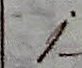1
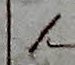1
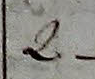2
